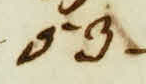53
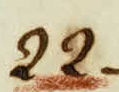22
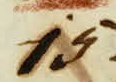15
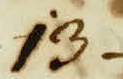13
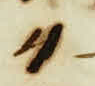4
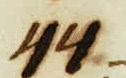44
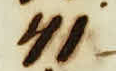41
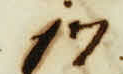17
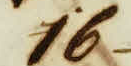16
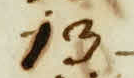13
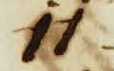11
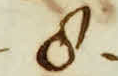8
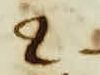2
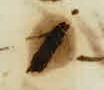1
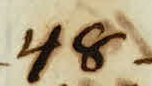48
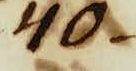40
